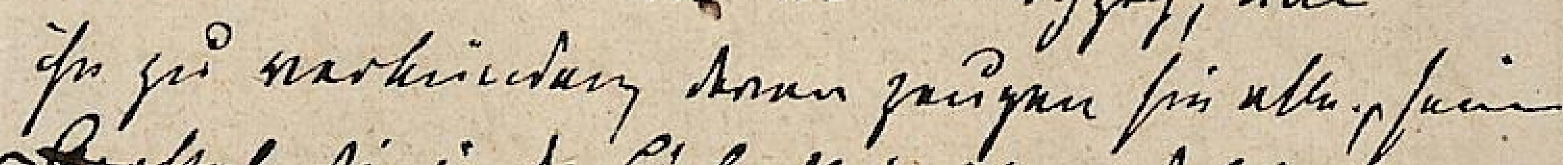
ihn zu verkünden, davon zeugen sie alle, seine
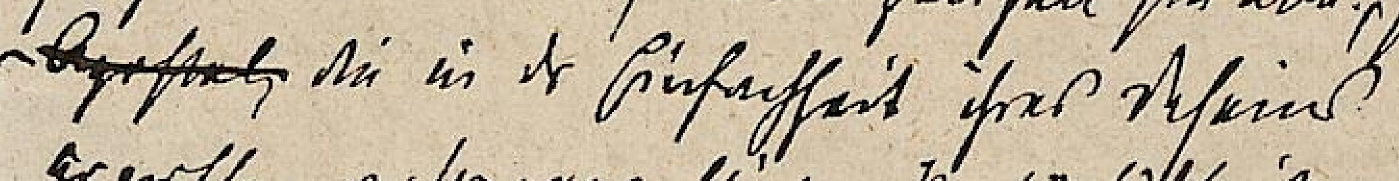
Apostel, die n dr Einfachfeit ihres Daseins
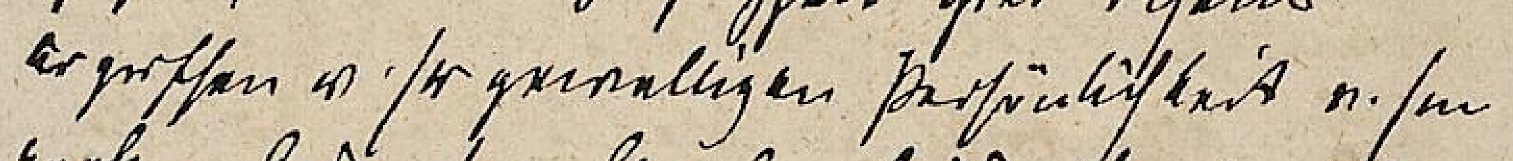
ergriffen v. sr gewalligen Persönlichteit v. sm
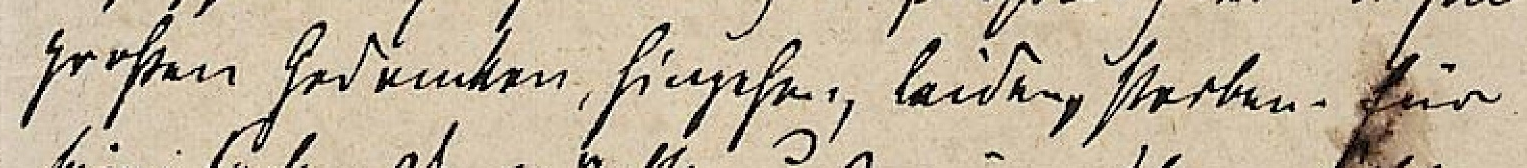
großen Gedanken, hingehen, leiden, sterben. für
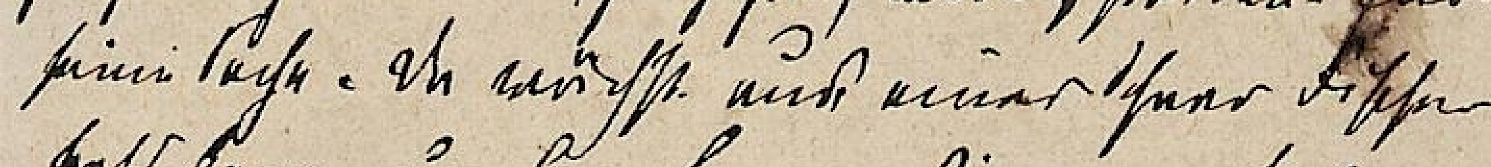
seine Sache. Da wächst aus einer Schaar Fische
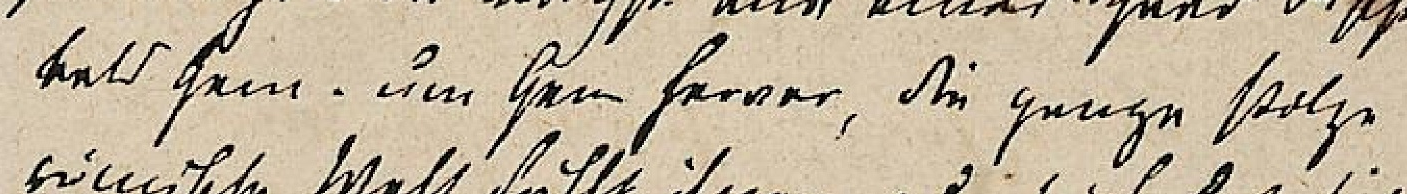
bald Gem. um Gem hervor, die ganze stolze
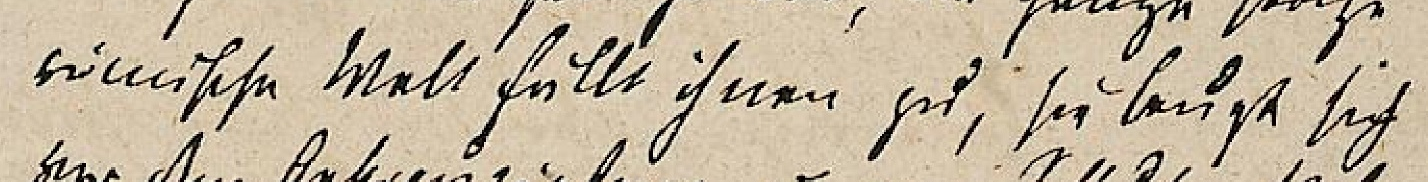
römische Welt fällt ihnen zu, sie beugt sich
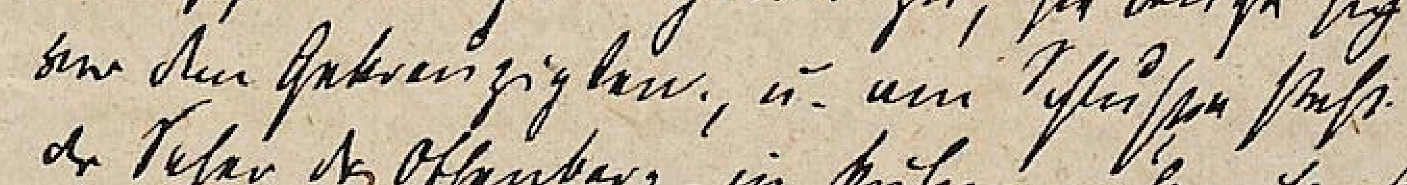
vor dem Gekreuzigten., u. am Schluße steht
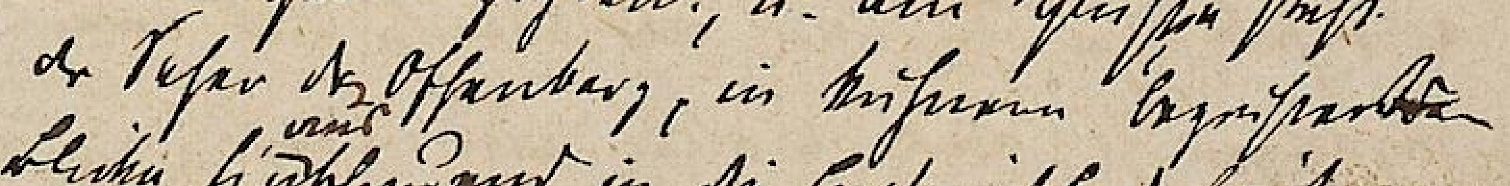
dr Seher dr Offenbarg, in kühnem begeistertem
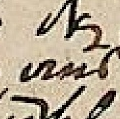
aus
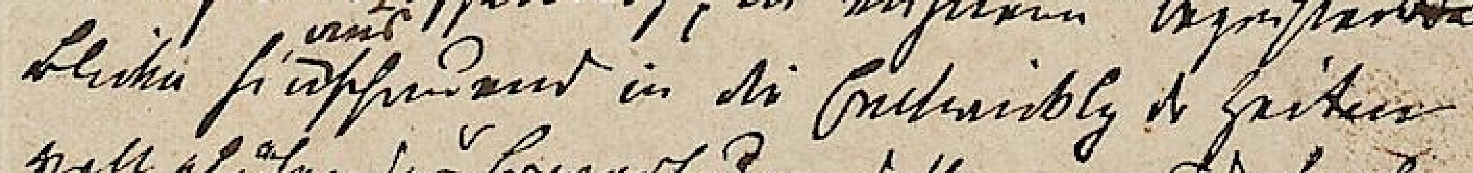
Blicke hinschauend in die Entwincklg dr Zeiten
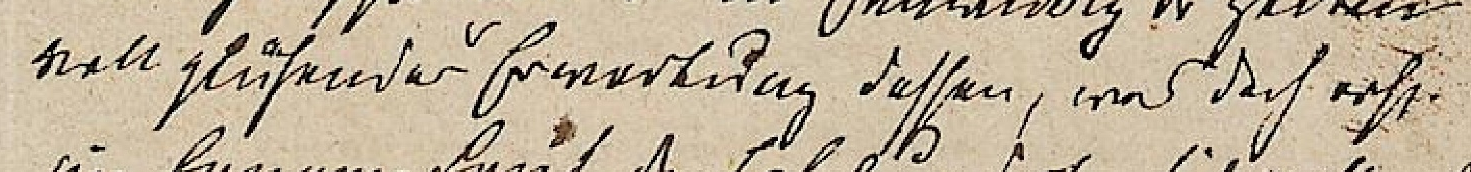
voll glühender Erwartung dessen, was doch erst.
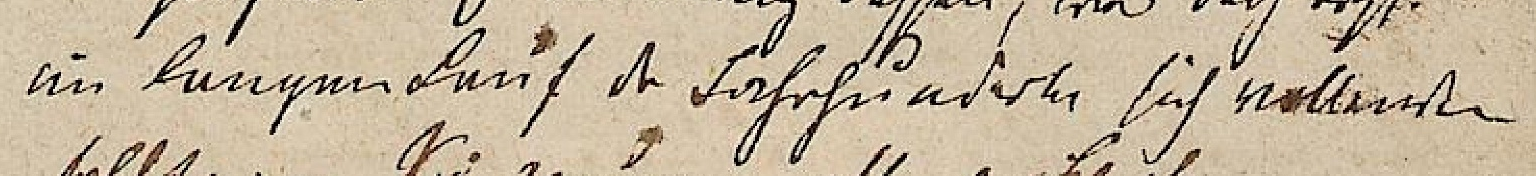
in langem Lauf dr Jhrhunderte sich vollenden
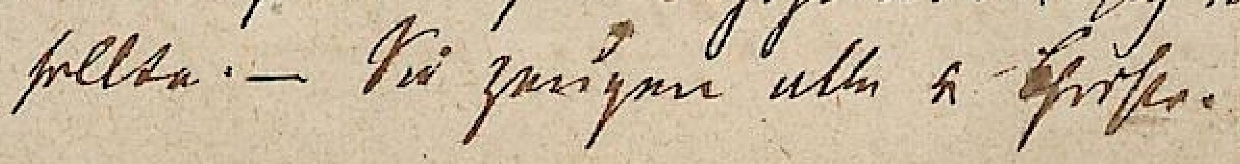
sollte. _ Sie zeugen alle v Christo.
